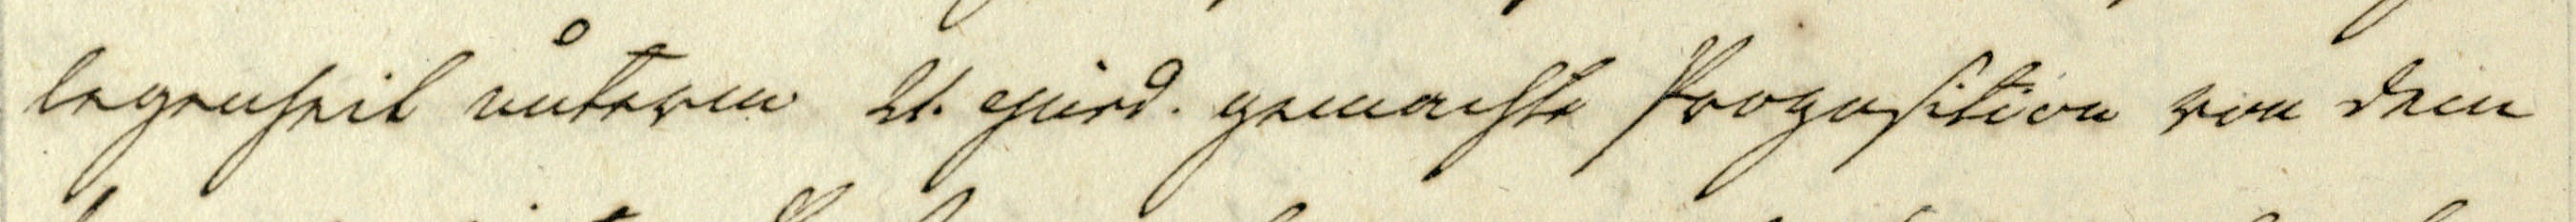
legenheit unterm 21. ejusd. gemachte Proposition von dem
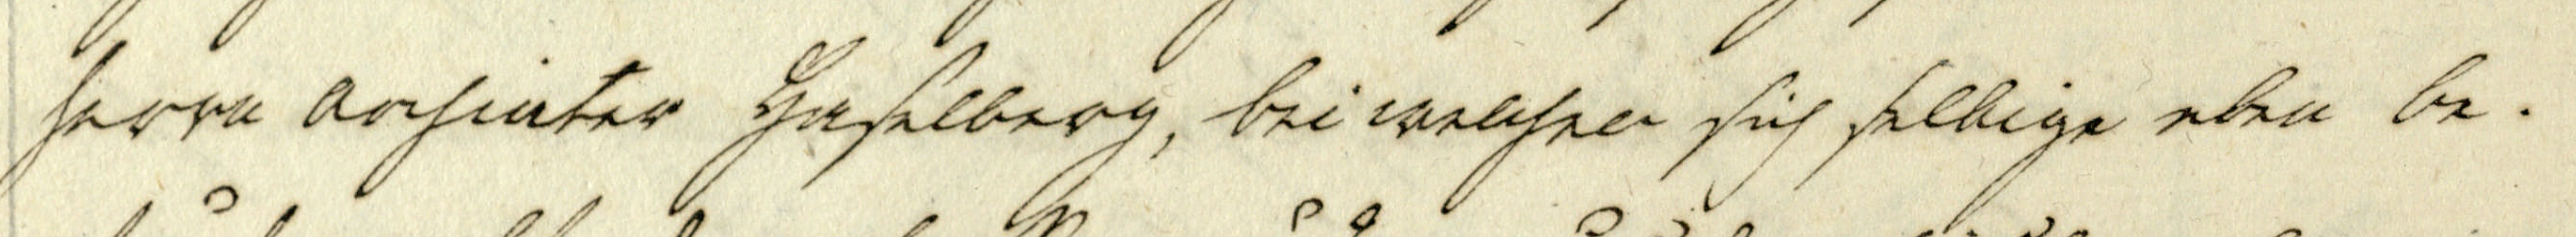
herrn Archiater Haselberg, bei welchen sich selbige eben be¬
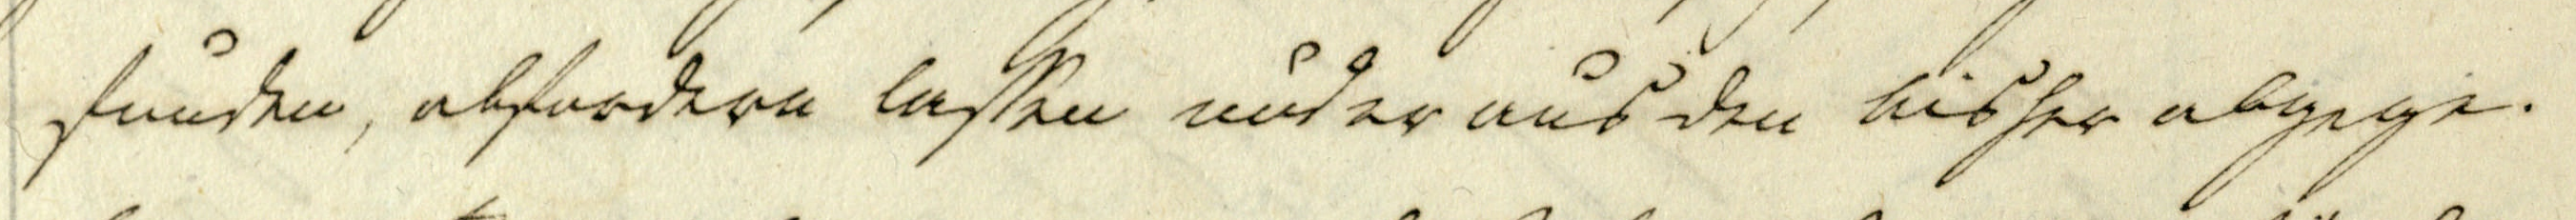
funden, abfordern lassen und er aus den bisher abgege¬
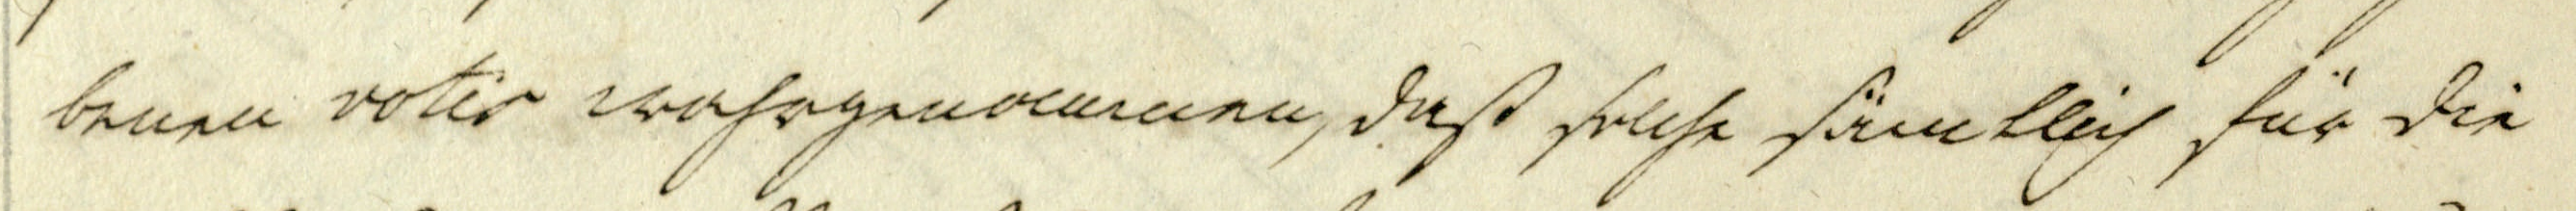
benen votis wahrgenommen, daß solche sämtlich für die
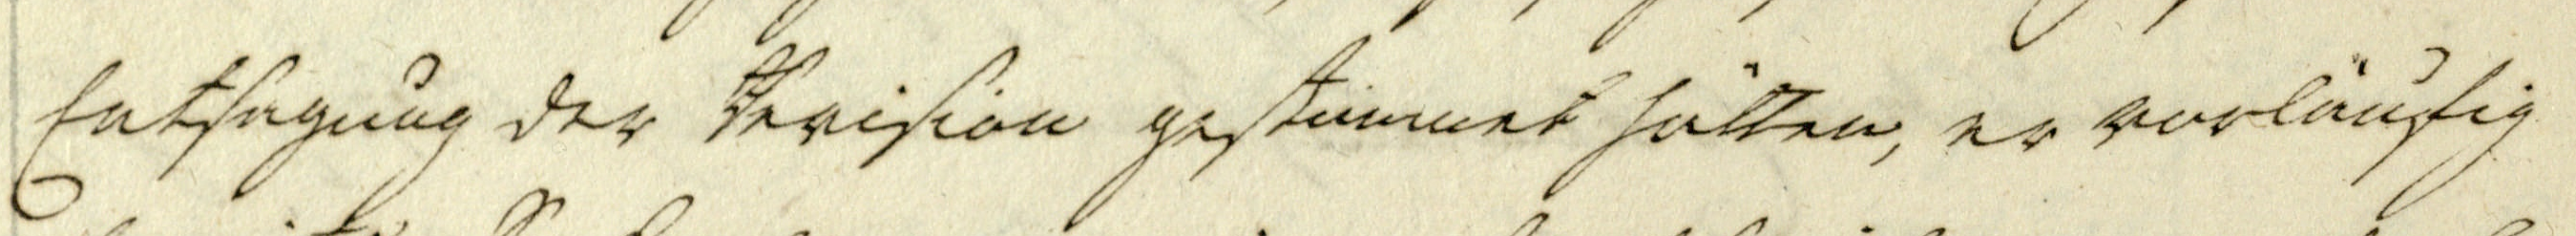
Entsagung der Revision gestimmet hätten, er vorläufig
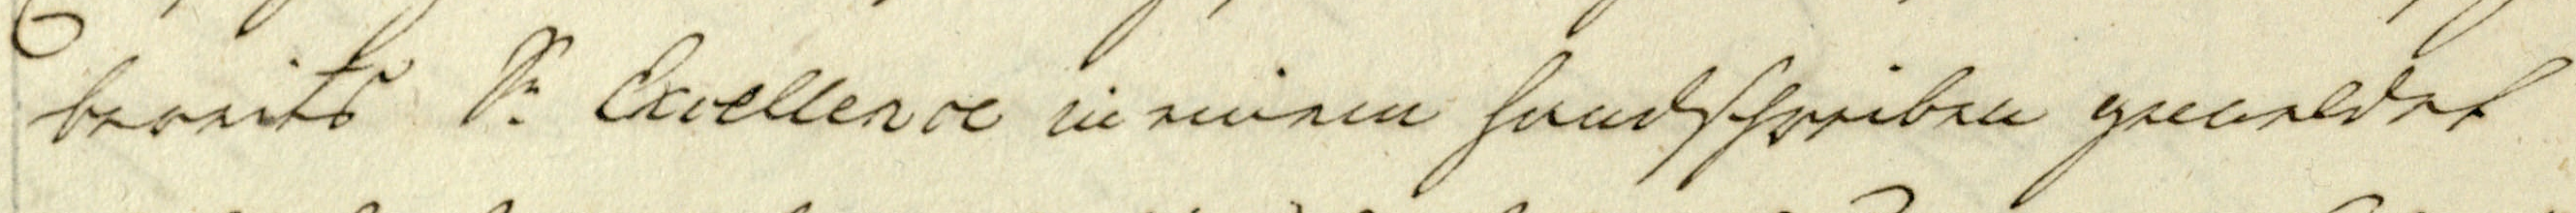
bereits Sr. Excellence in einem Handschreiben gemeldet
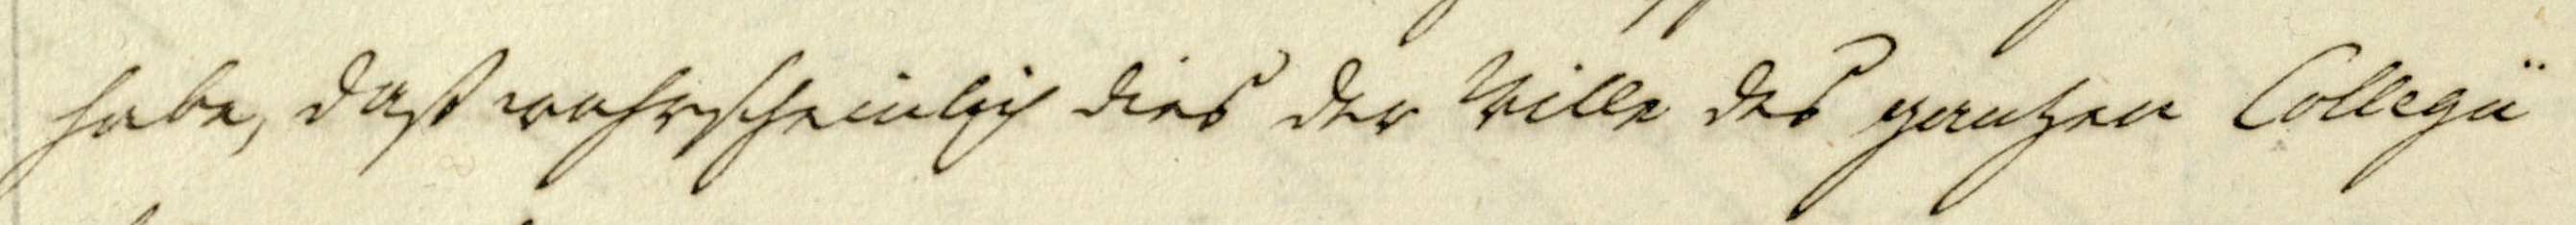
habe, daß wahrscheinlich dies der Wille des ganzen Collegii
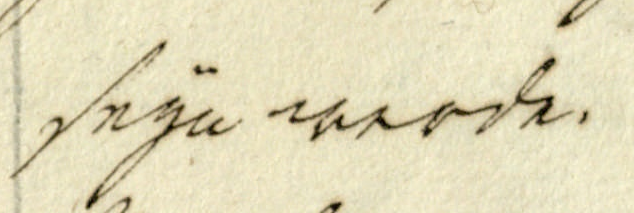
seÿn werde.
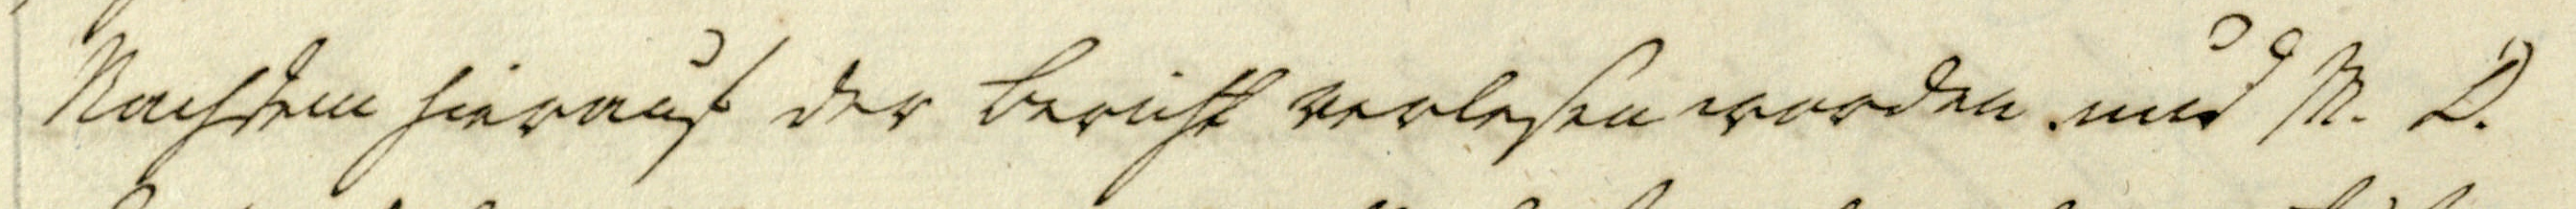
Nachdem hierauf der Bericht verlesen worden und M. D.
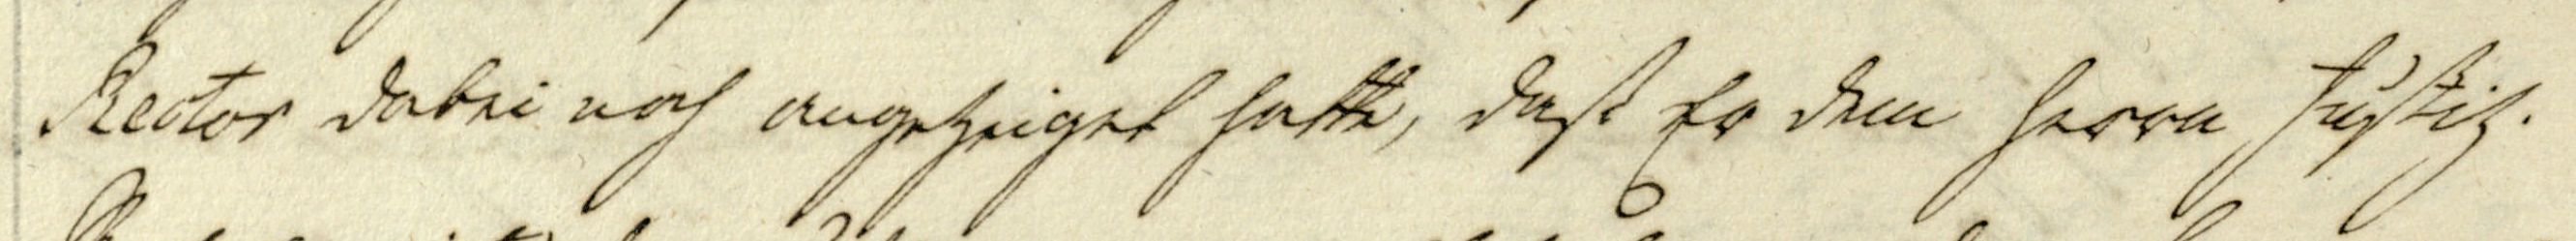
Rector dabei noch angezeiget hatte, daß Er dem herrn Justiz¬
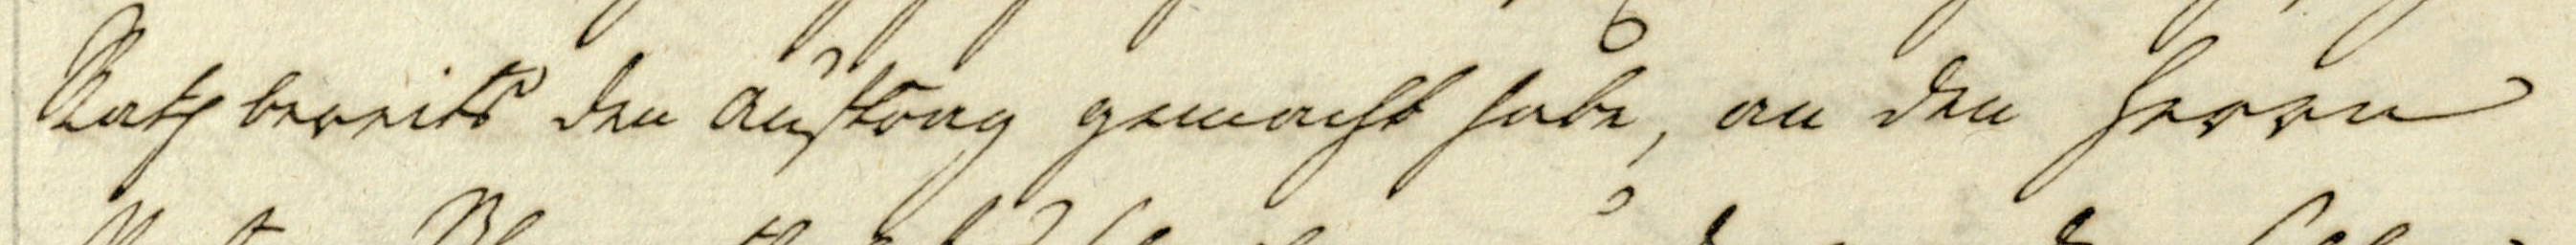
Rath bereits den Auftrag gemacht habe, an den herrn
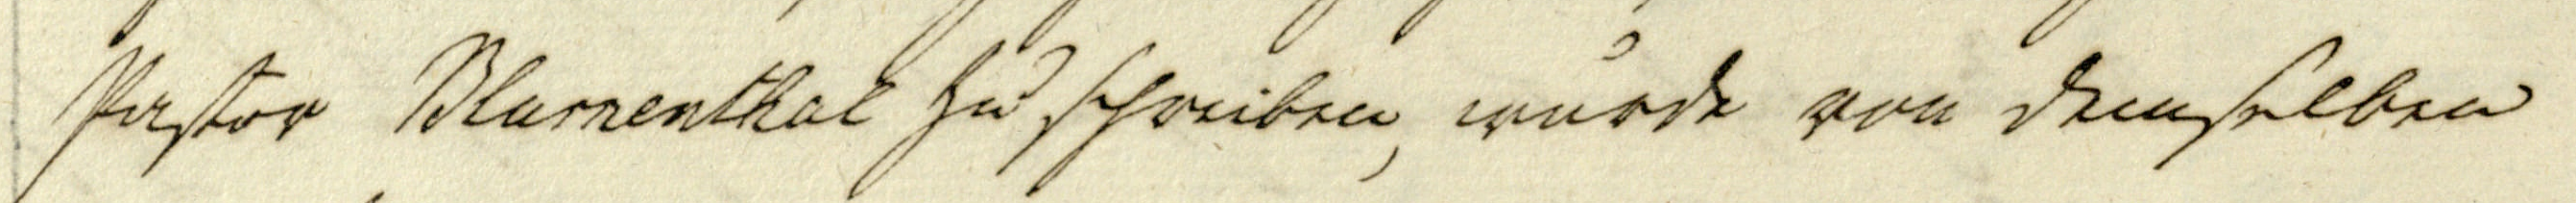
Pastor Blumenthal zu schreiben, wurde von demselben
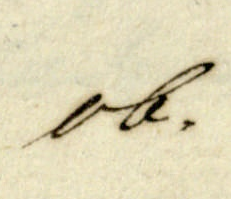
ob
